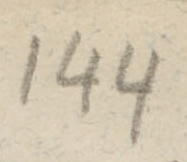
144
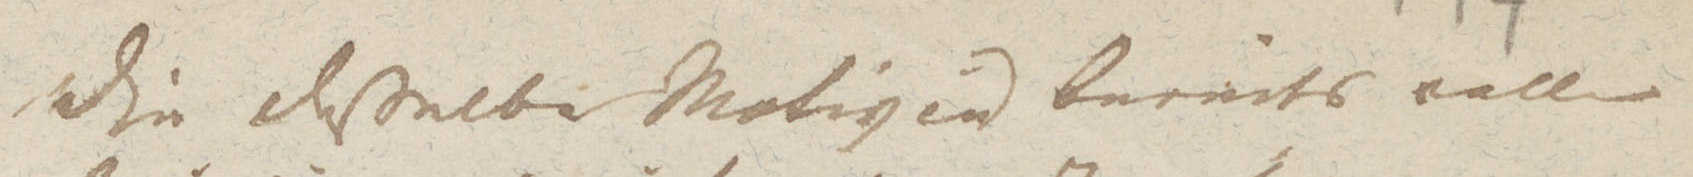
Die dasselbe Motiv und bereits voll-
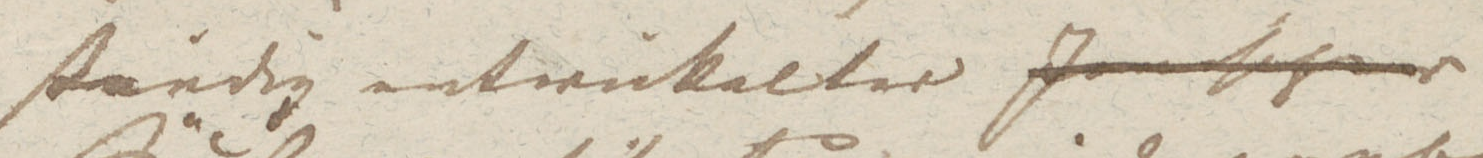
ständig entwickelter Ionischer
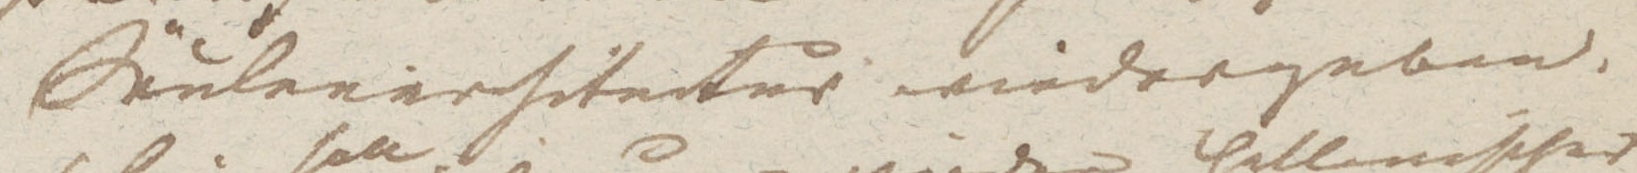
Säulenarchitectur wiedergeben.
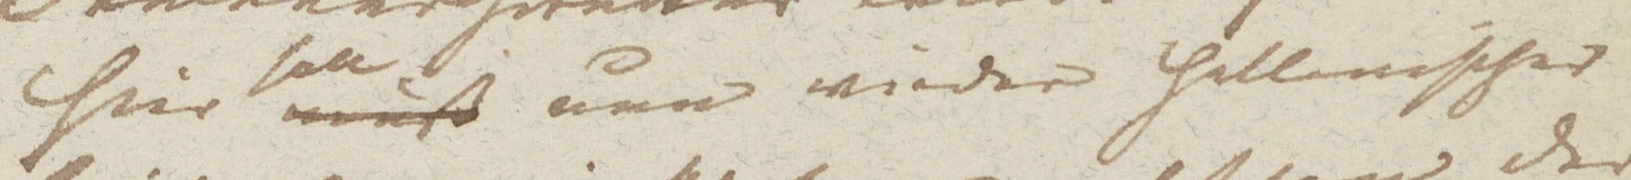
Hier muss soll nun wieder Hellenischer
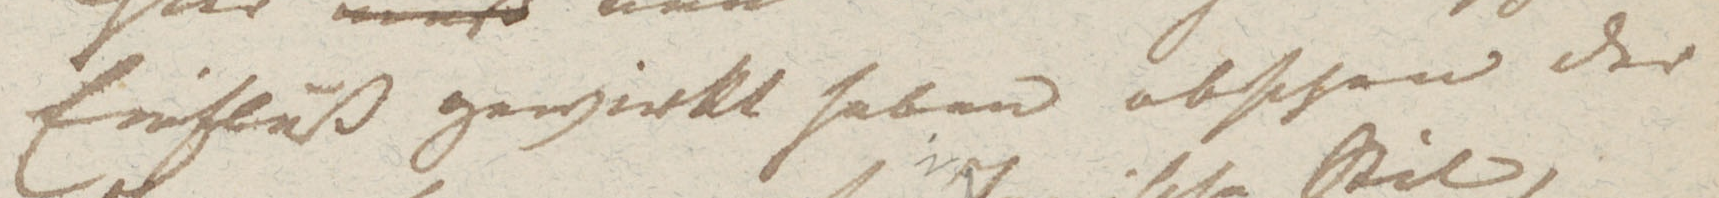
Einfluss gewirkt haben obschon der
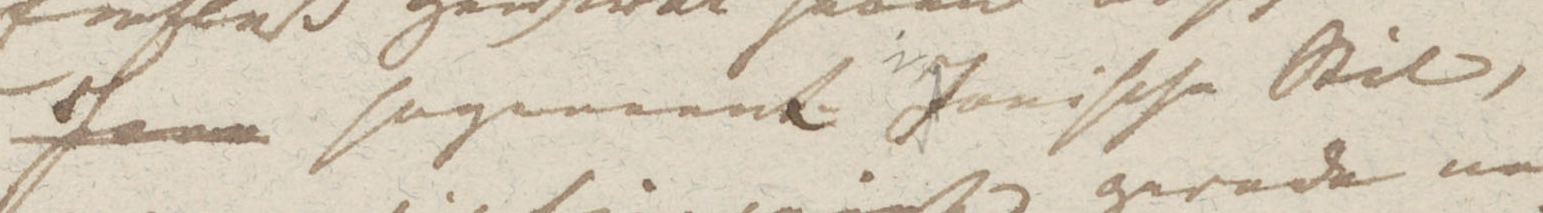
Ioni sogenannt Iionische Stil,
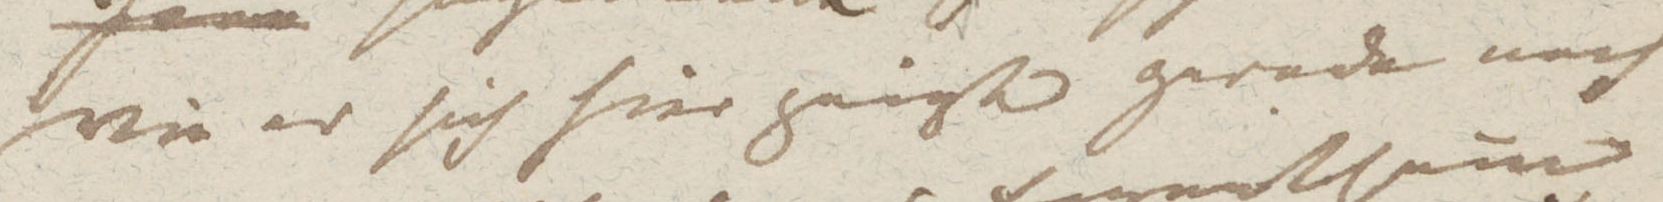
wie er sich hier zeigt gerade noch
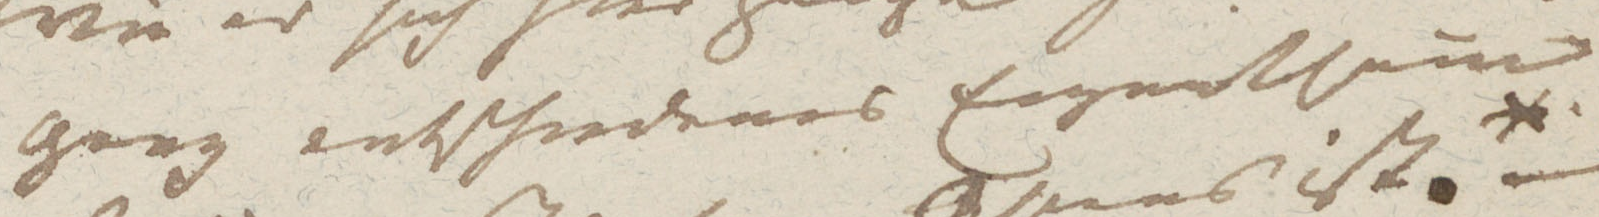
ganz entschiedenes Eigenthum
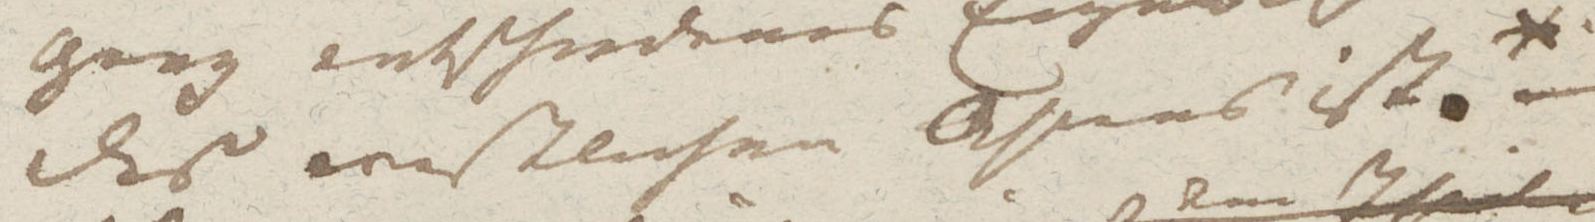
des westlichen Asiens ist. – %
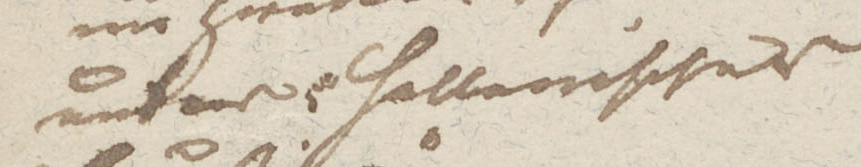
unter "Hellenischer
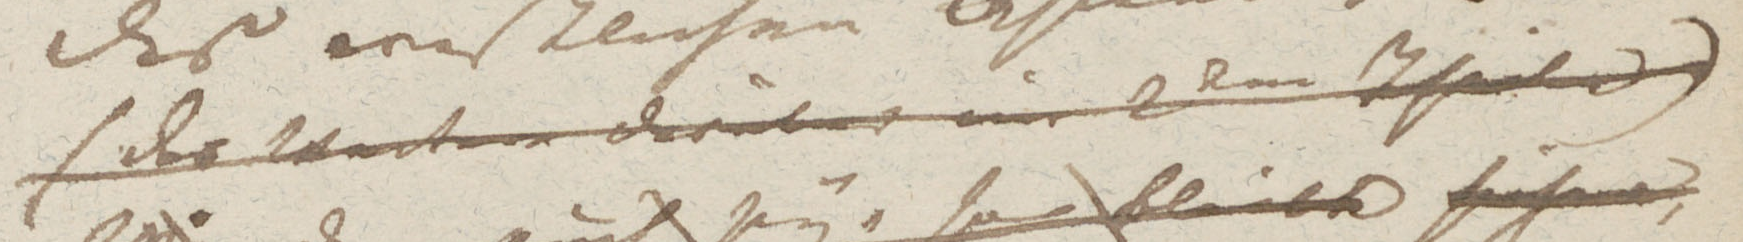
(Das Weitere darüber im 2ten Theile)
